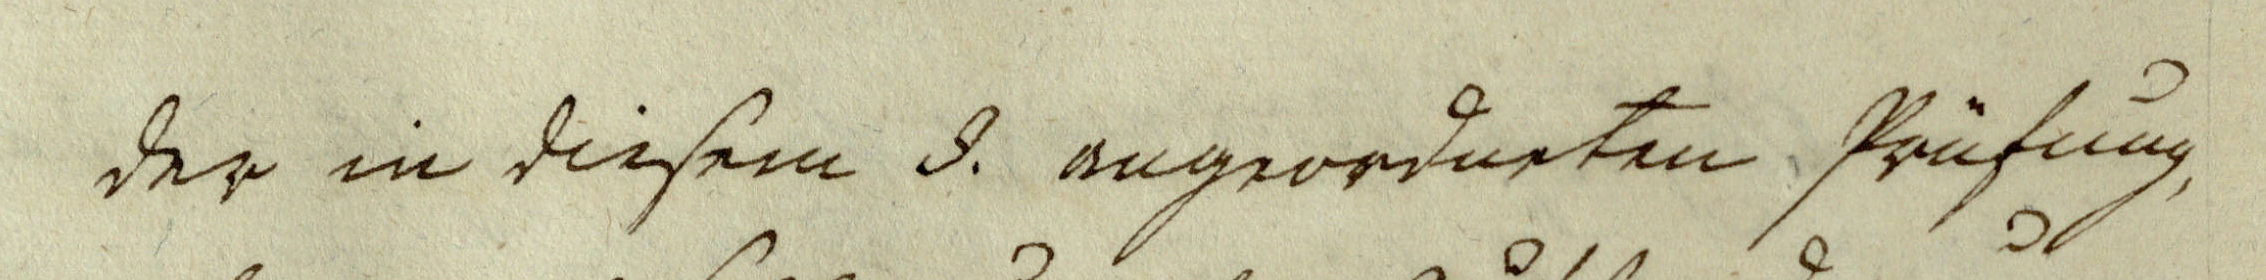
der in diesem §. angeordneten Prüfung
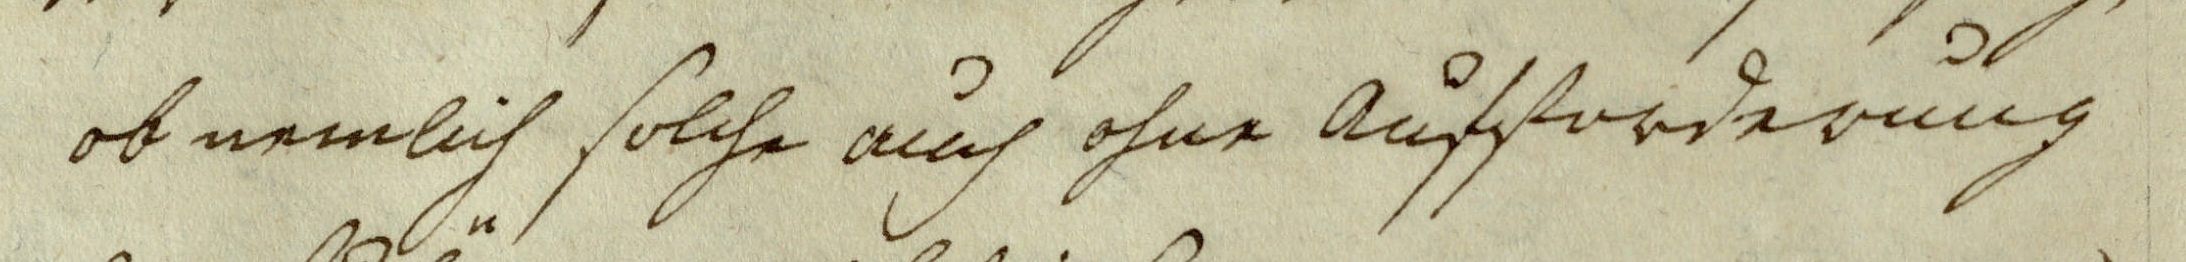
ob nemlich solche auch ohne Aufforderung
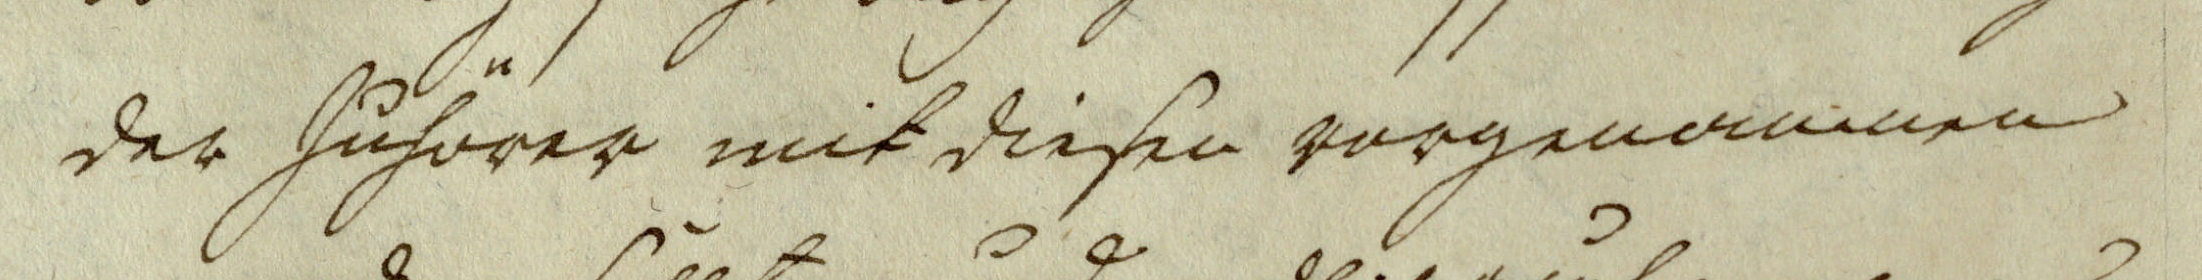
der Zuhörer mit diesen vorgenommen
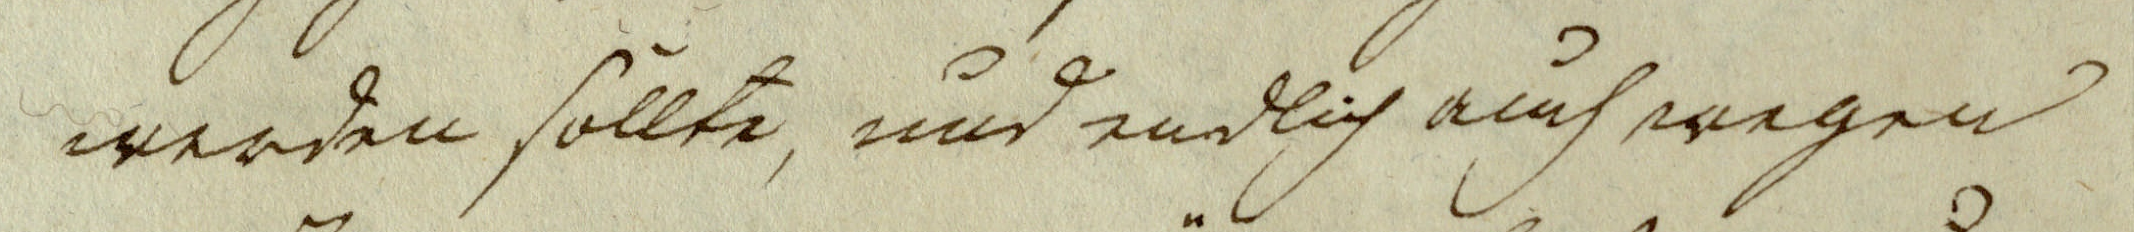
werden sollte, und endlich auch wegen
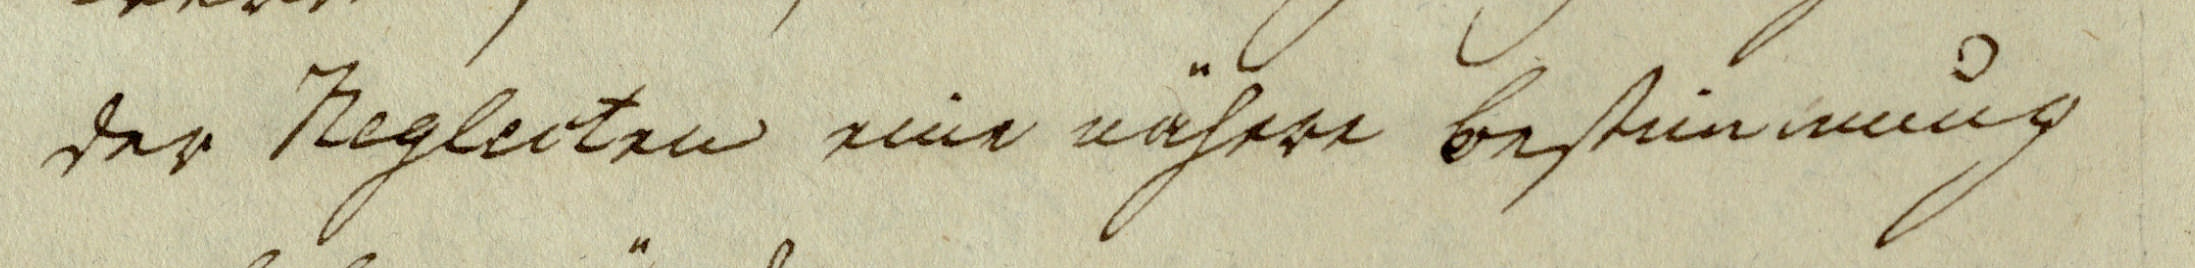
der Neglecten eine nähere Bestimmung
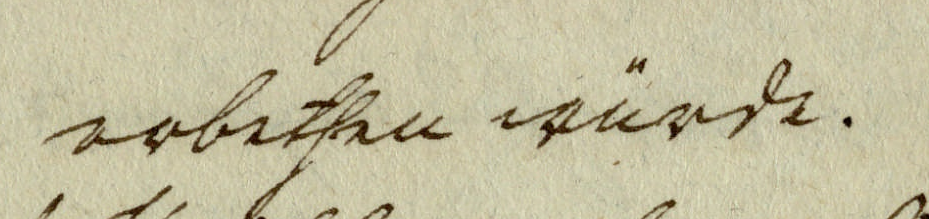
erbethen würde.
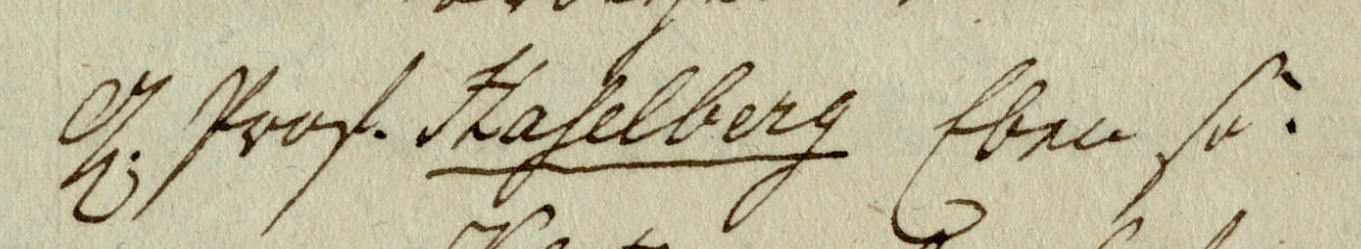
dh. Prof. Haselberg Eben so.
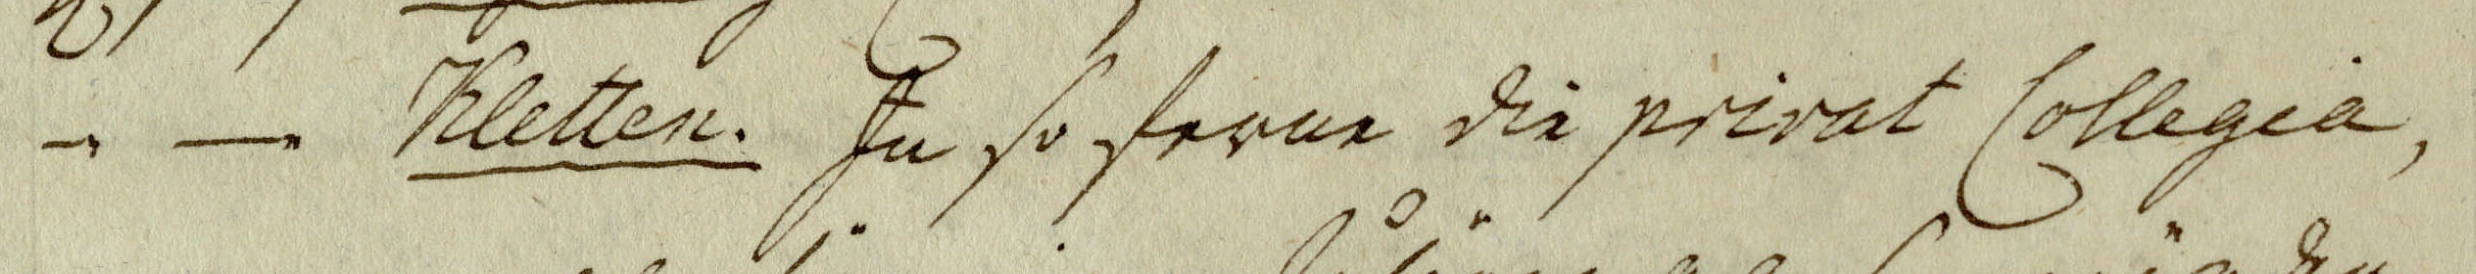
Kletten. In so ferne die privat Collegia,
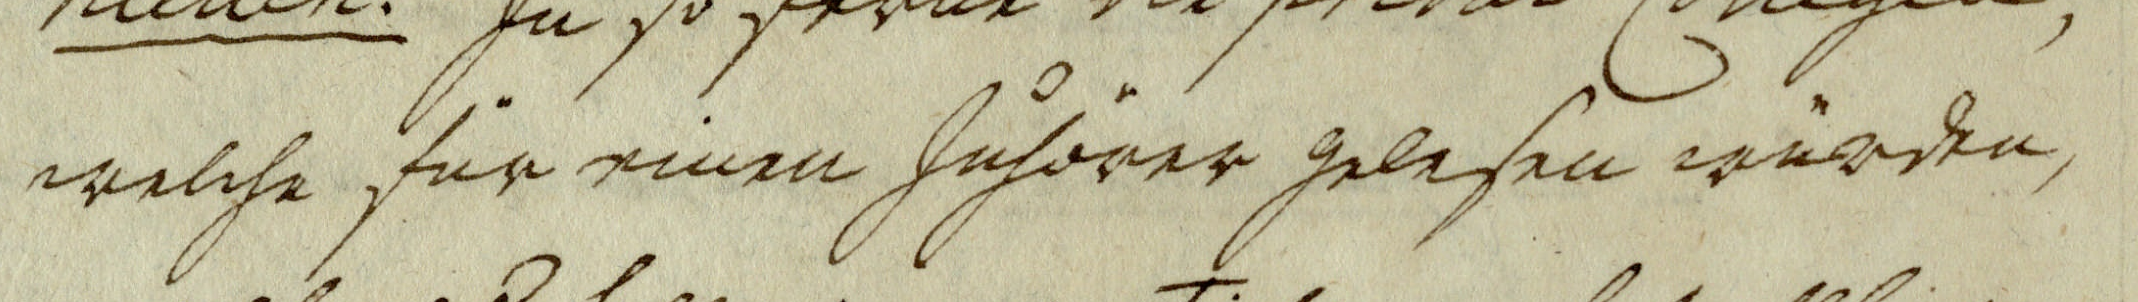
welche für einen Zuhörer gelesen würden,
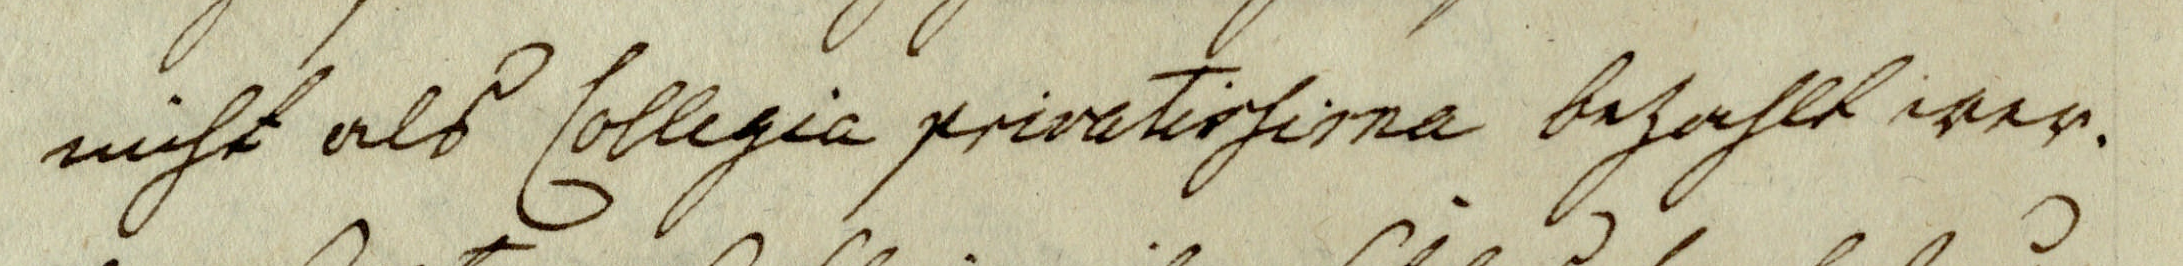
nicht als Collegia privatissima bezahlt wer¬
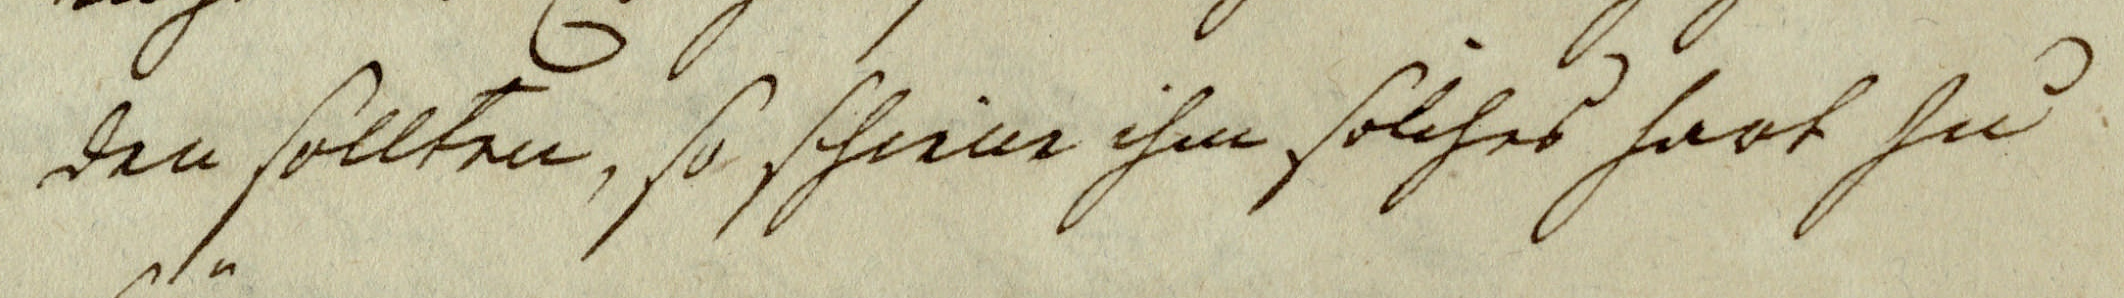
den sollten, so schiene ihm solches hart zu
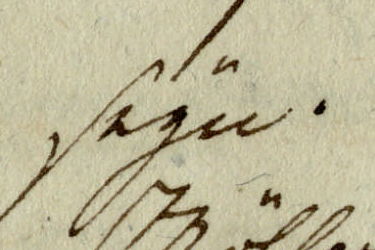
seÿn.
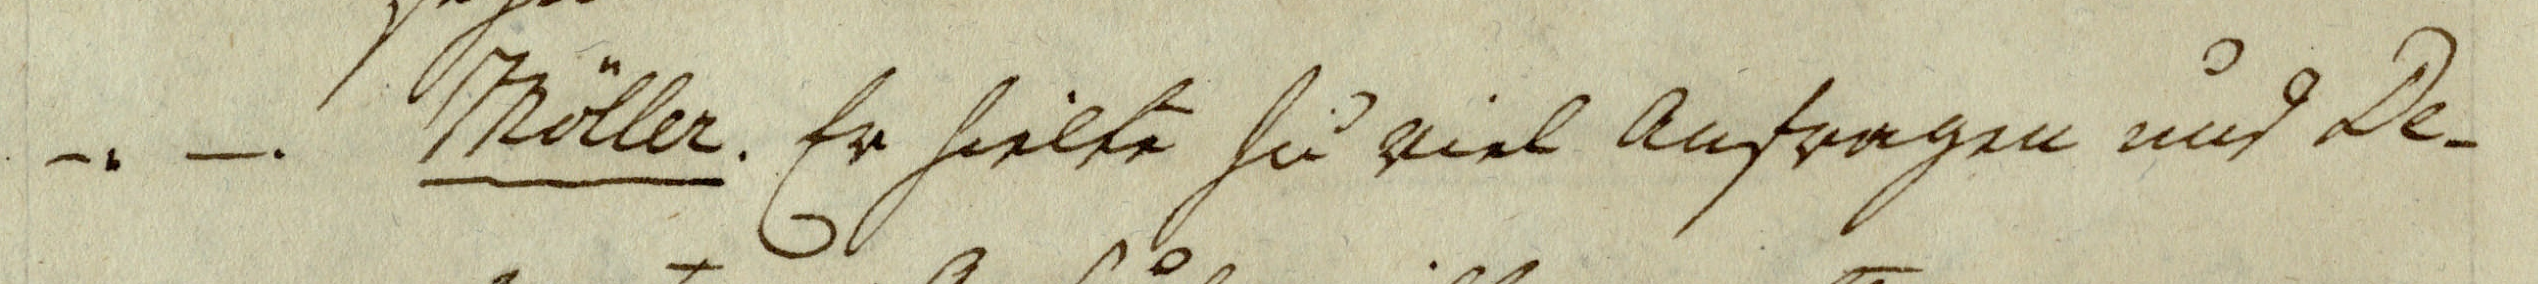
Möller. Er hielte zu viel Anfragen und De¬
